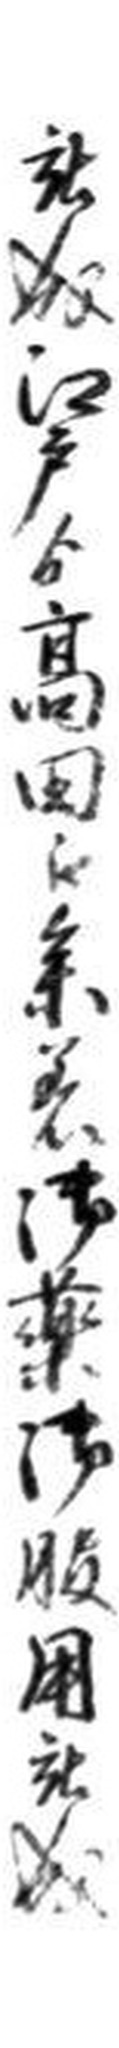被成江戸ゟ高田江参着御薬御服用被成
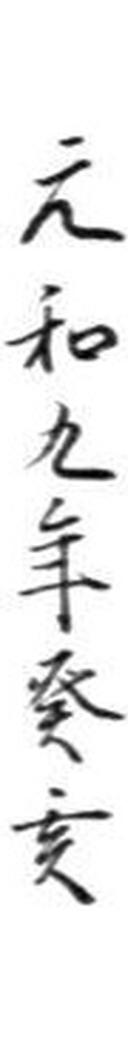元和九年癸亥
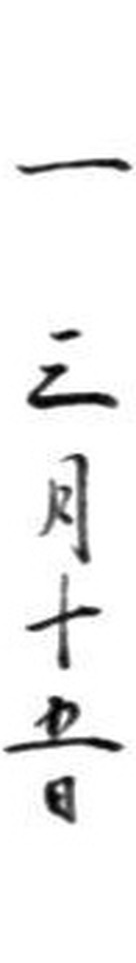一三月十五日
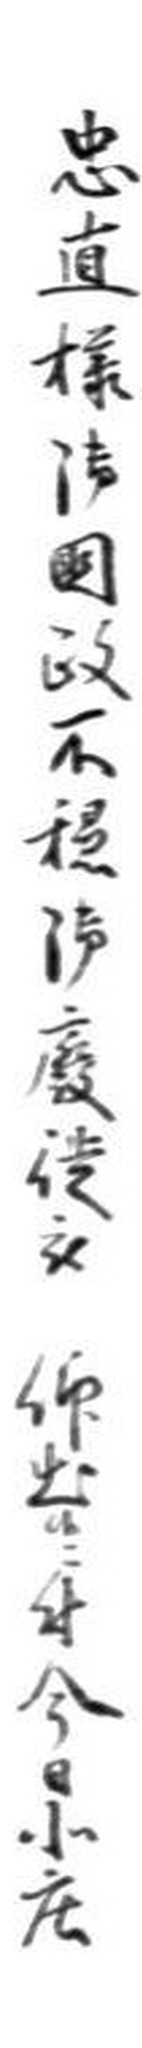忠直様御国政不穏御廃徙被仰出候ニ付今日北庄
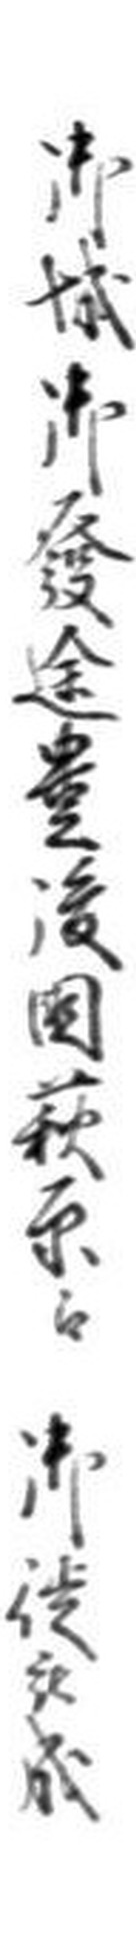御城御発途豊後国萩原江御徙被成
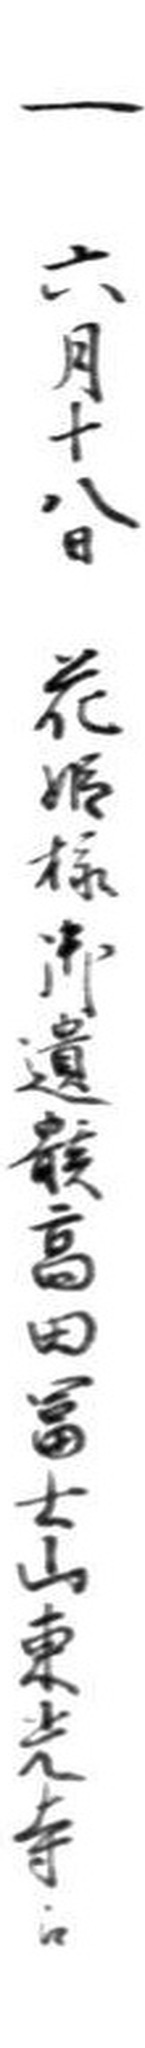一六月十八日花姫様御遺骸高田冨士山東光寺江
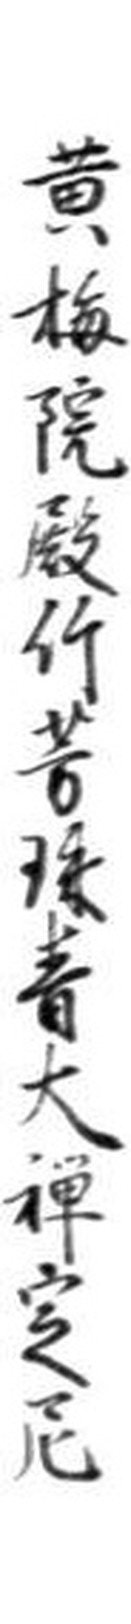黄梅院殿竹芳珠青大禅定尼

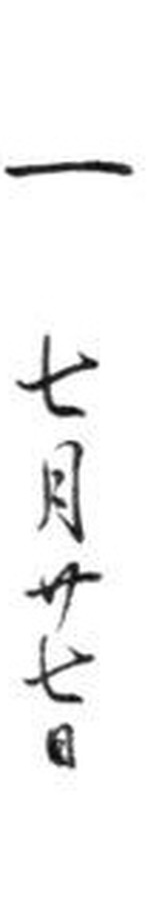一七月廿七日
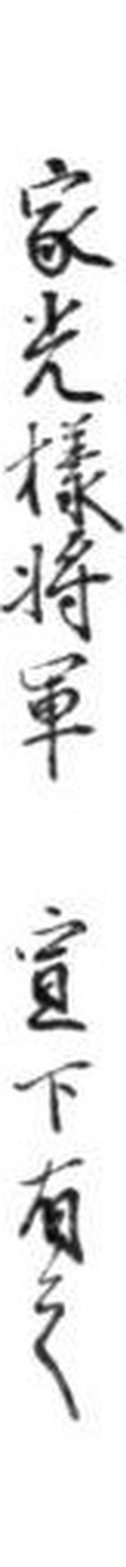家光様将軍宣下有之
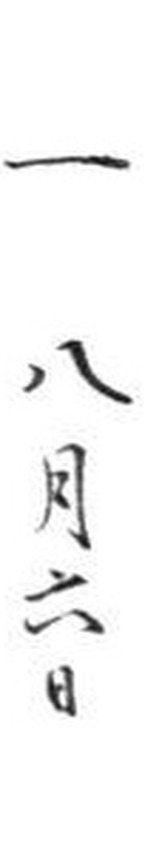一八月六日
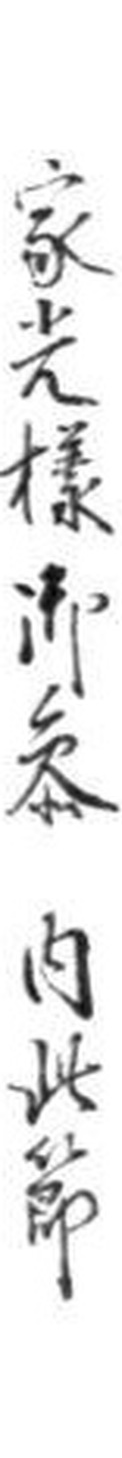家光様御参内此節
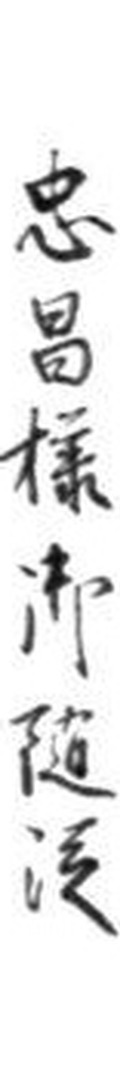忠昌様御随従
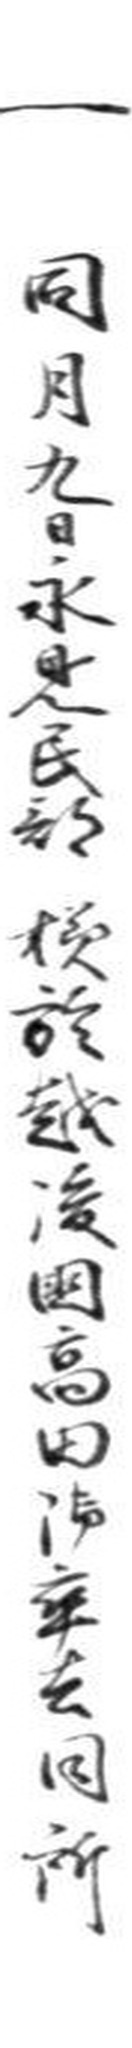一同月九日永見民部様於越後国高田御卒去同所
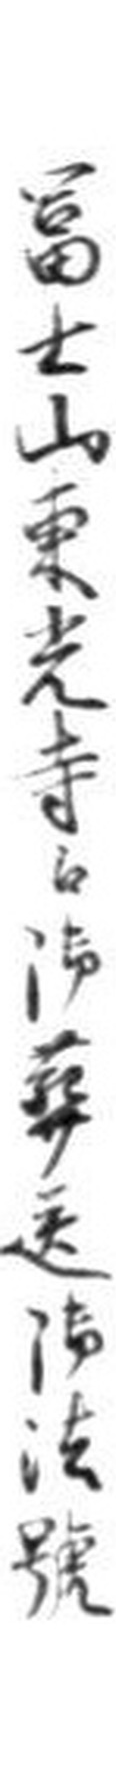冨士山東光寺江御葬送御法号
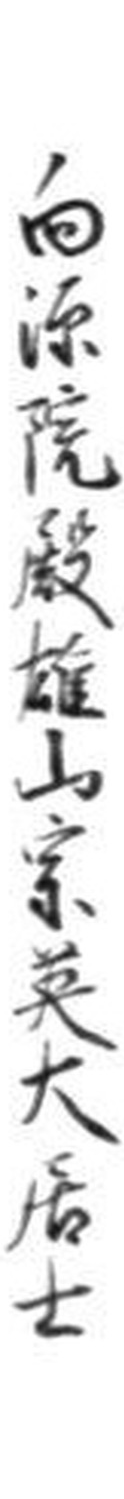向源院殿雄山宗英大居士
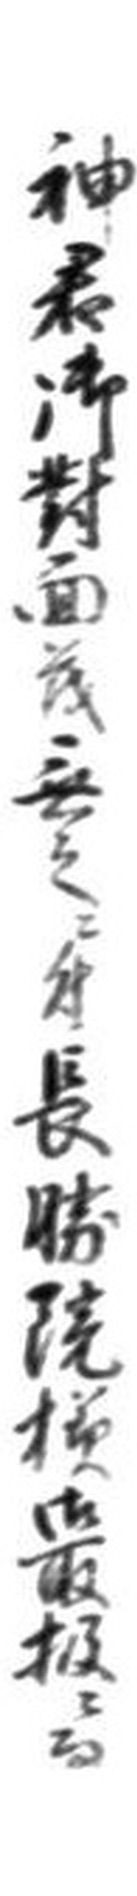神君御対面も無之ニ付長勝院様御取扱ニ而
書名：家譜 三 忠昌公 従慶長八年到寛永六年
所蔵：福井県文書館 Fukui Prefectural Archives
